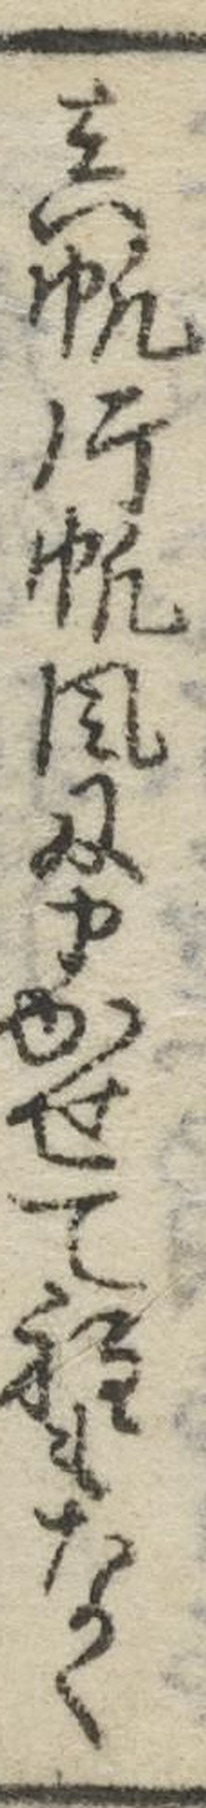真帆片帆風にまかせて程もなく
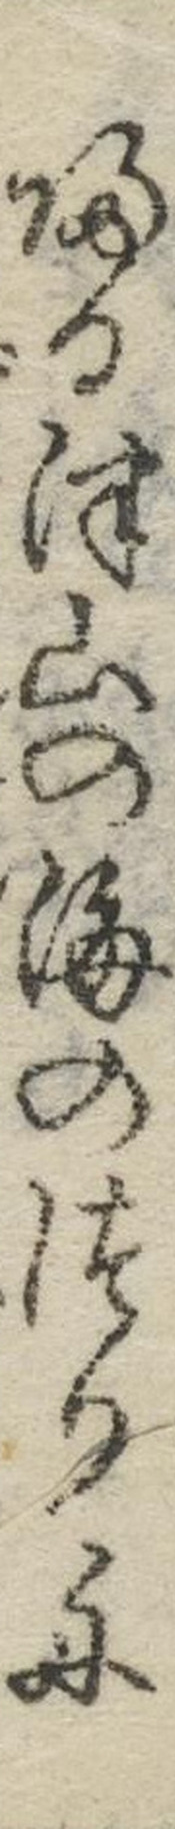帰る津山の海のつり舟
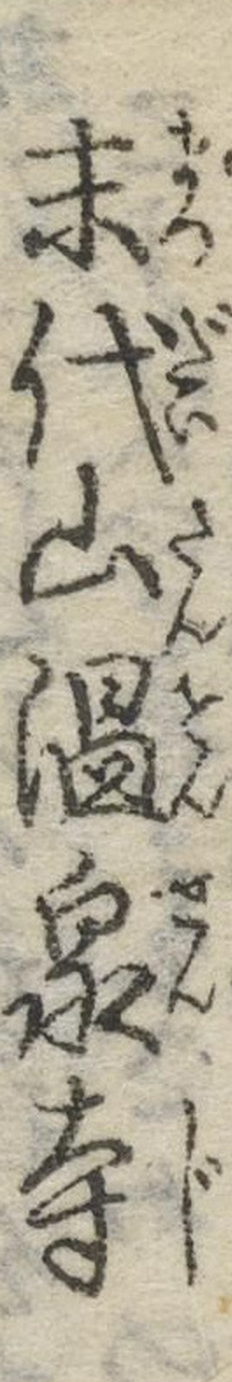末代山温泉寺
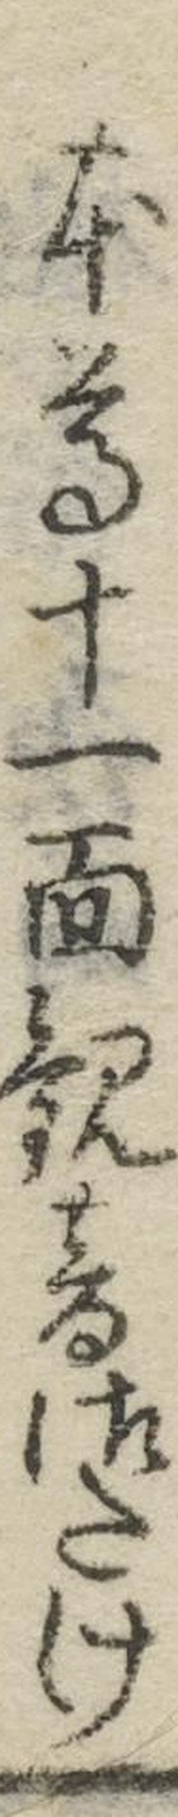本尊十一面観音さたけ
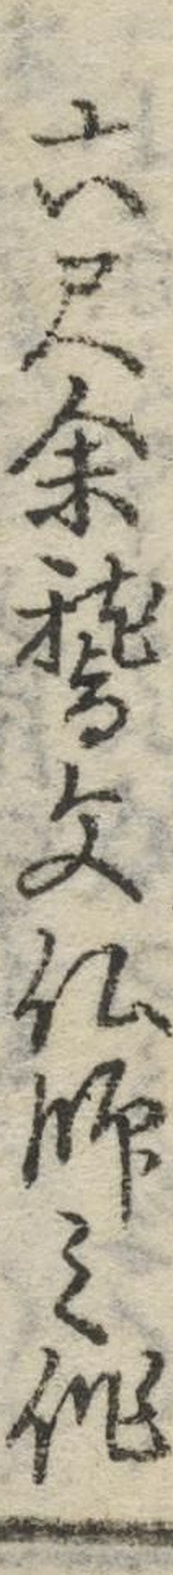六尺余稽文仏師之作
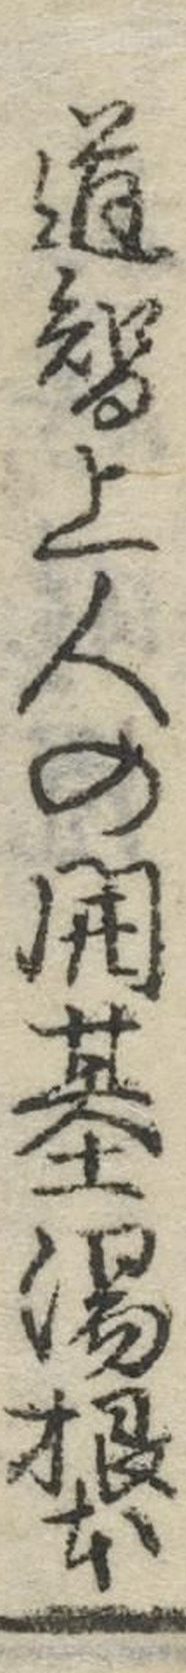道智上人の開基湯根本
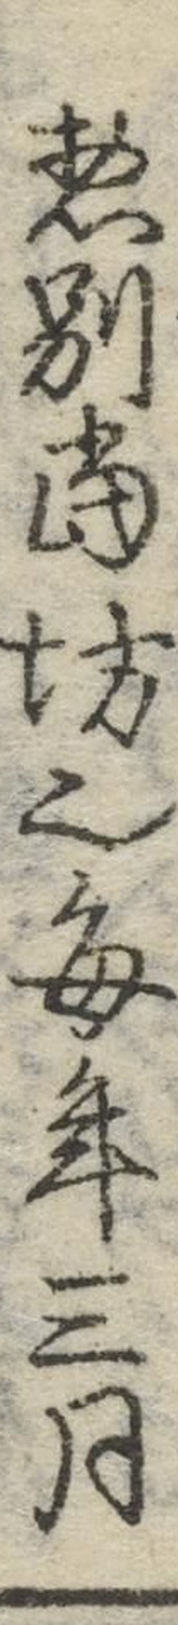惣別当坊也毎年三月
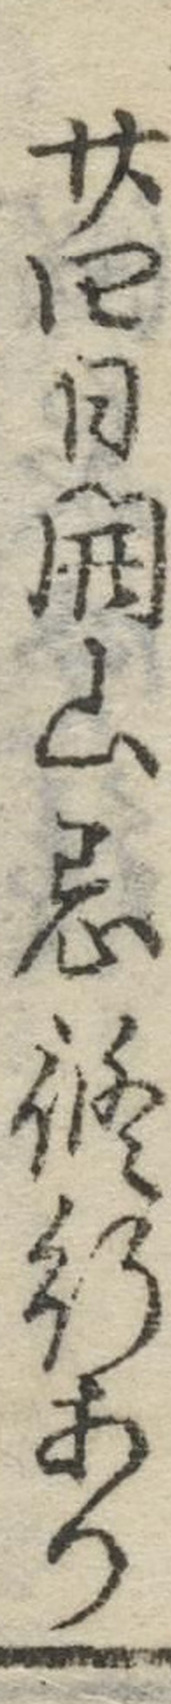廿四日開山忌修行あり
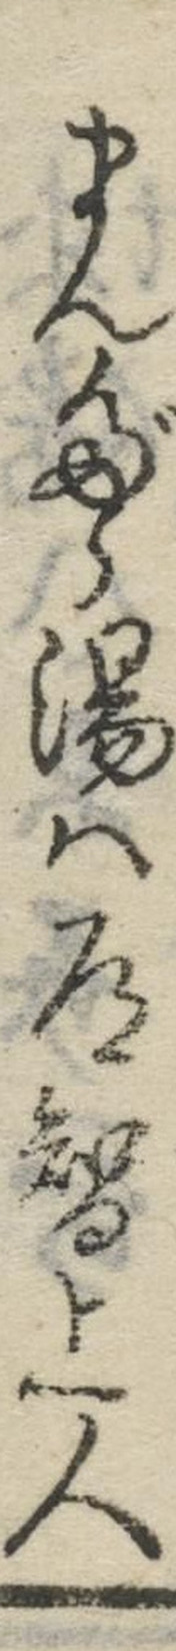まんだら湯は道智上人
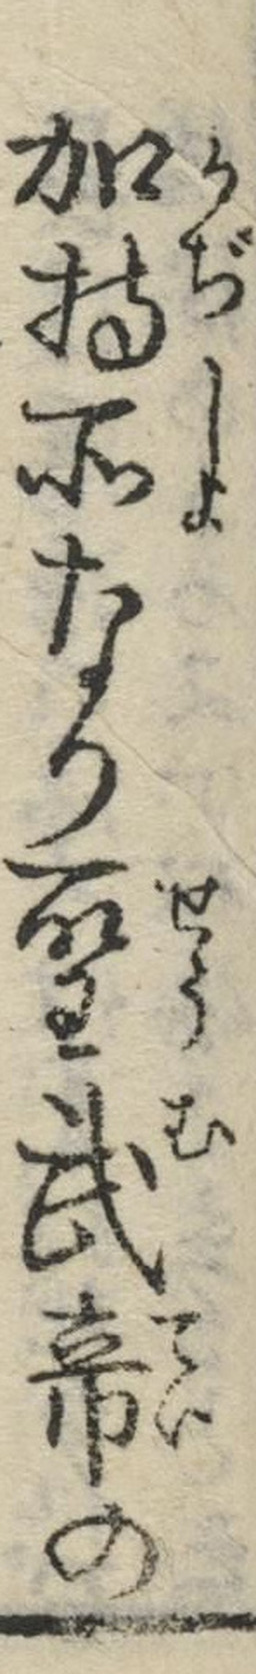加持所なり聖武帝の
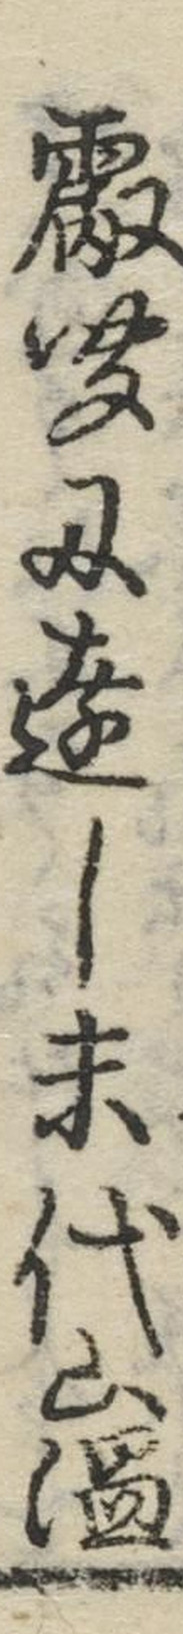叡聞に達し末代山温
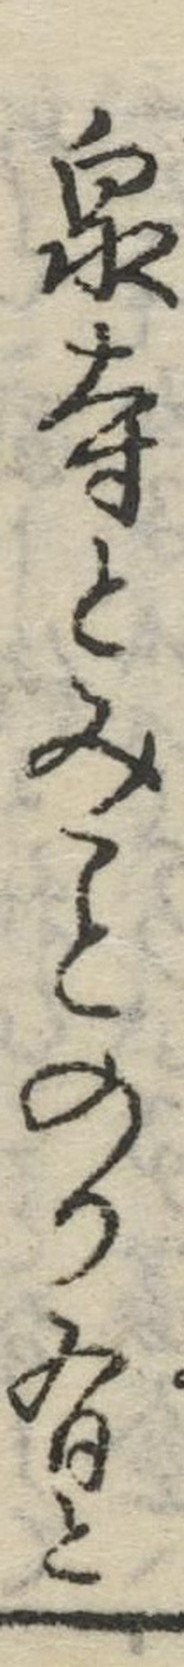泉寺とみことのり有と
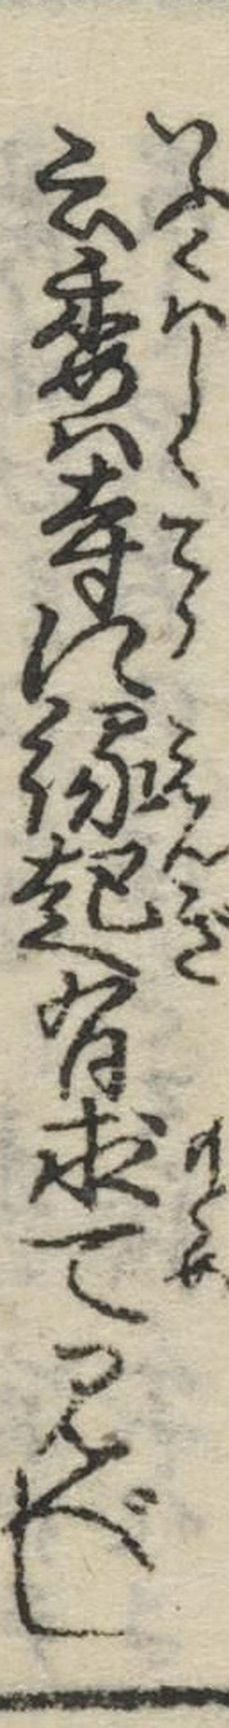云委は寺に縁起有求て見べし
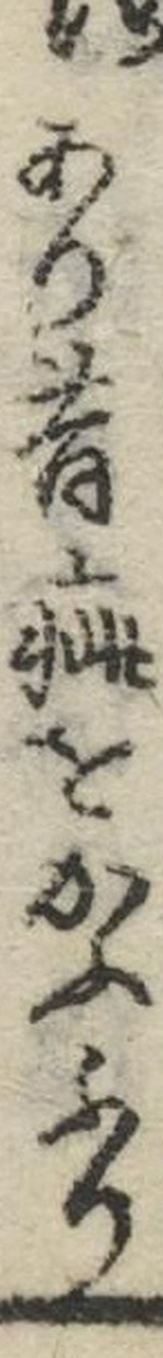あり昔疵をかふふり
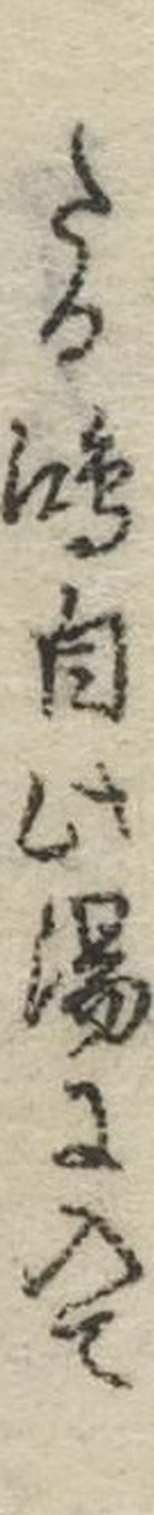たる鴻自此湯に入て
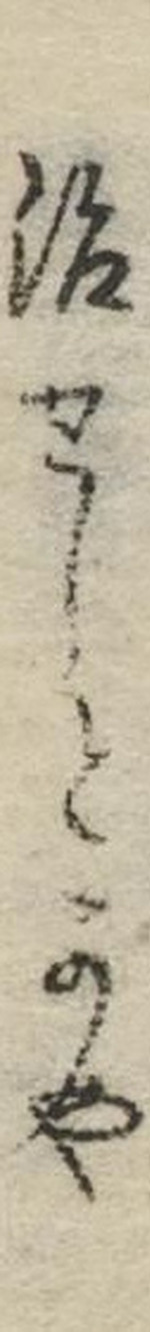治せしとかや
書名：但州城崎浴湯辧
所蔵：東京大学地震研究所図書室 Earthquake Research Institute Library, The University of Tokyo, JAPAN
